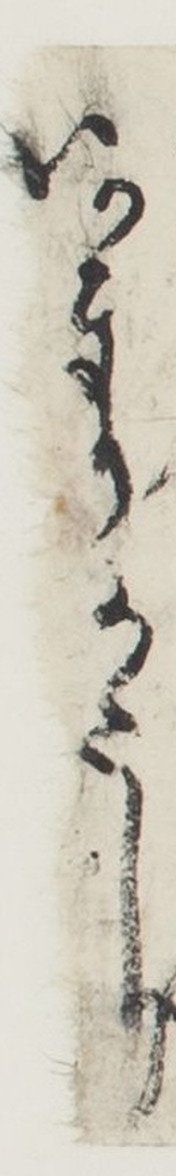あまりかたしけ
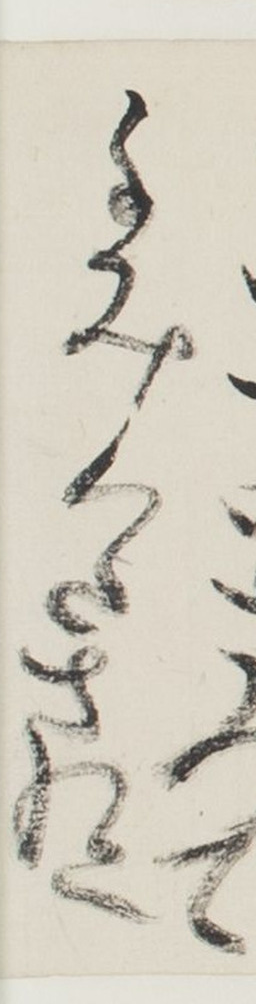よみくたされ候
